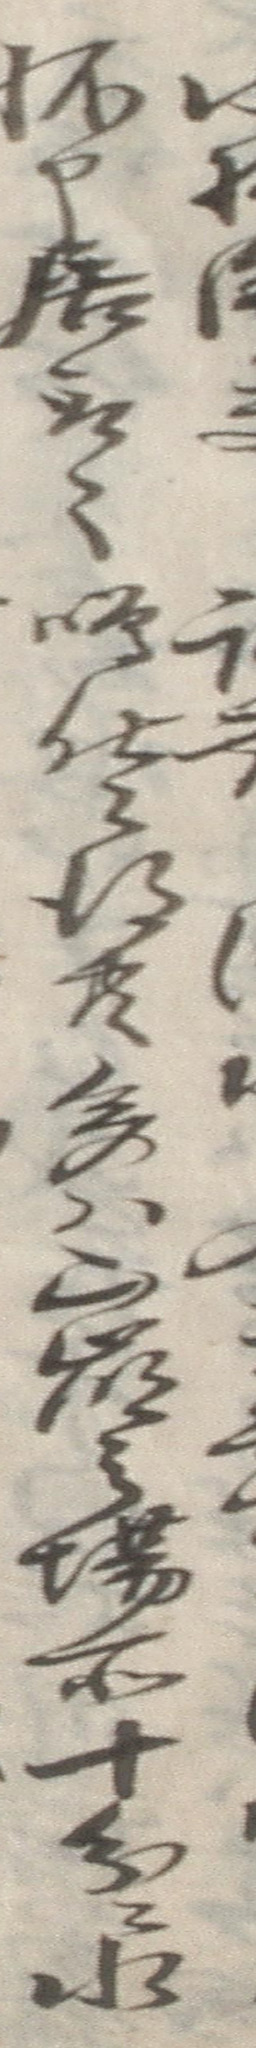抔申居取々噂仕候得共多ハ山崩之場所十分二水
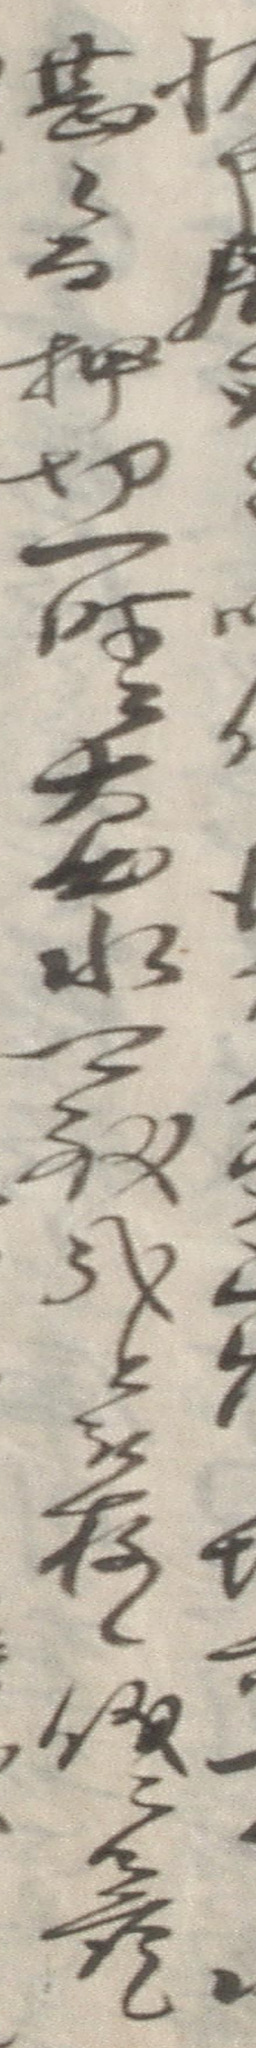湛候而押切一時二大出水可致哉と被存候儀二御座候
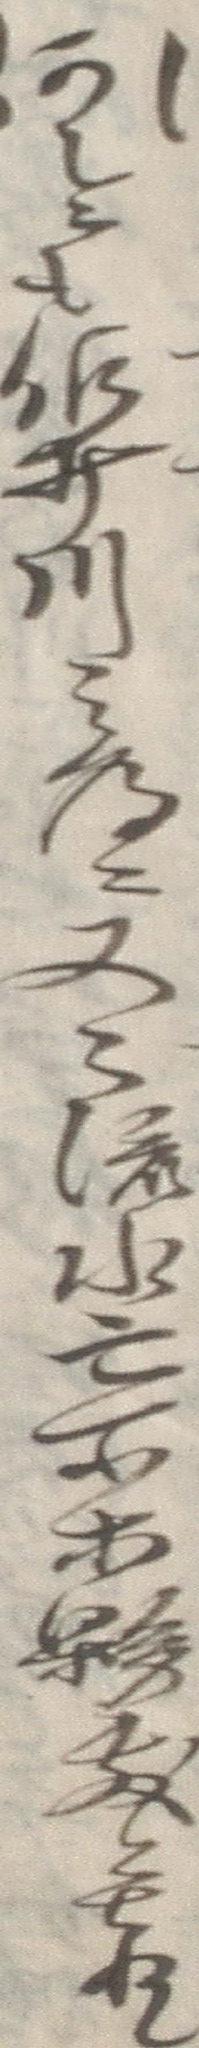何ㇾ二も佐井川之為二又々流水亡所等夥敷二は存候
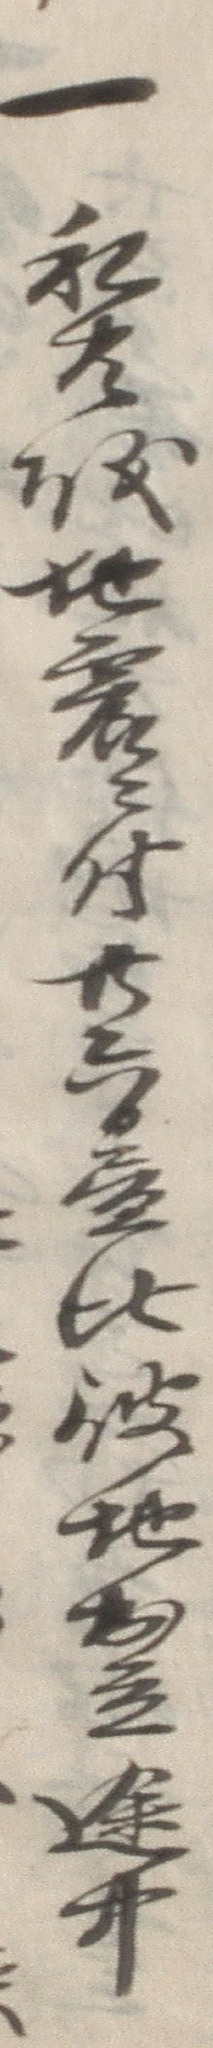一私共儀地震二付廿六日昼比彼地出立途中
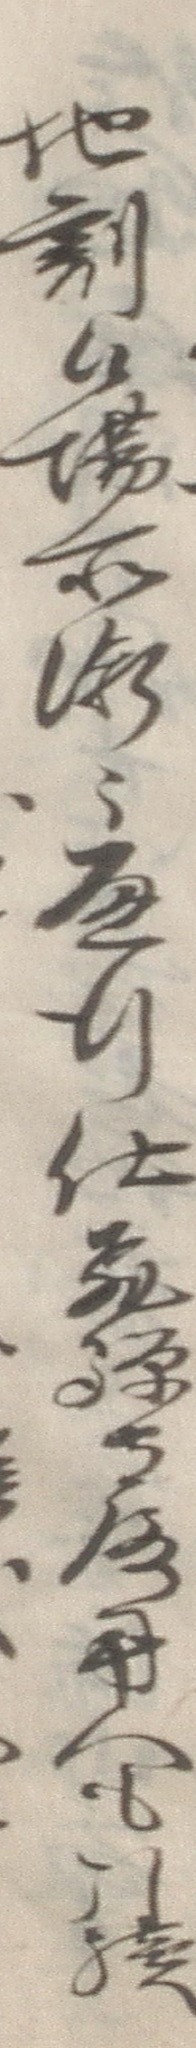地割候場所漸々通行仕飛騨守殿用人も引続
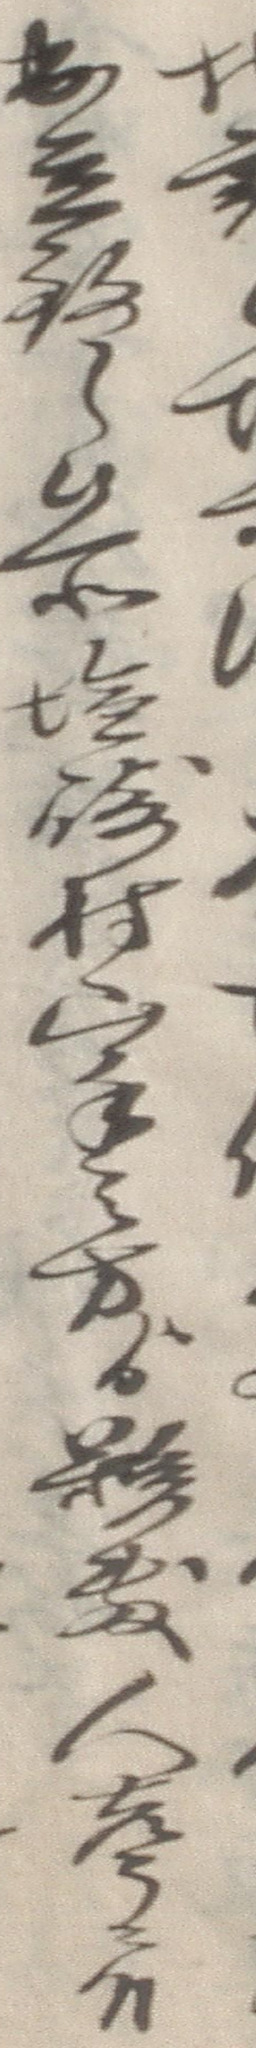出立致し候所塩崎村山手之方ゟ夥敷人声二付
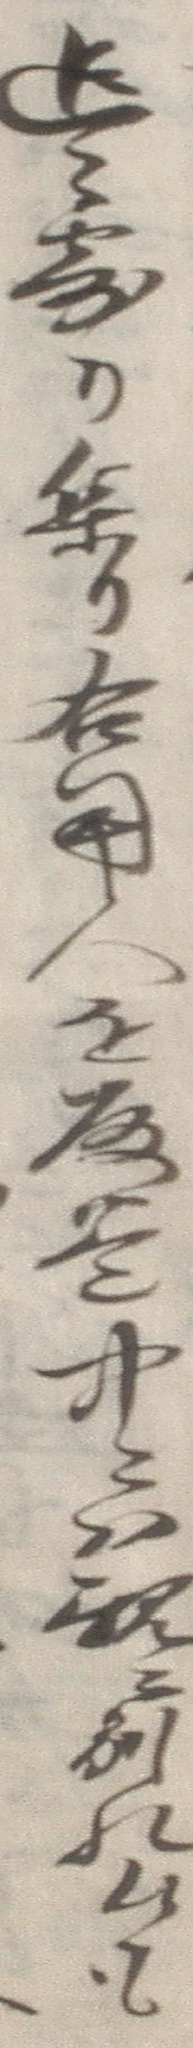追々寄り集り右用人を取巻中二ハ現二別れ候も
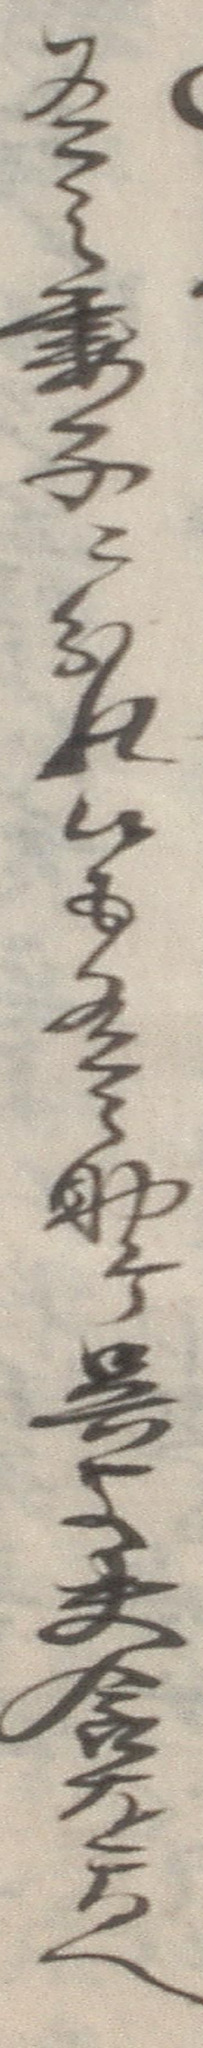有之妻子二分れ候も有之助ヶ呉よ夫食を与へ
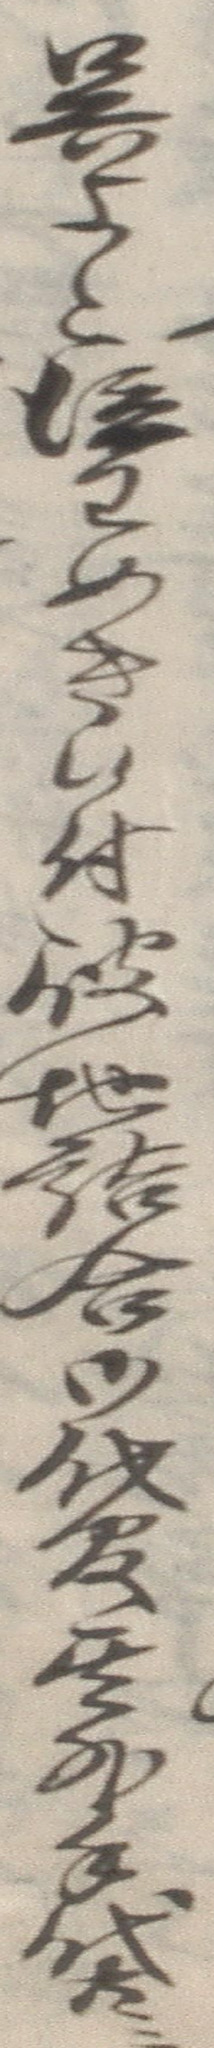呉よと泣わめき候二付彼地詰合御代官其外手代共二
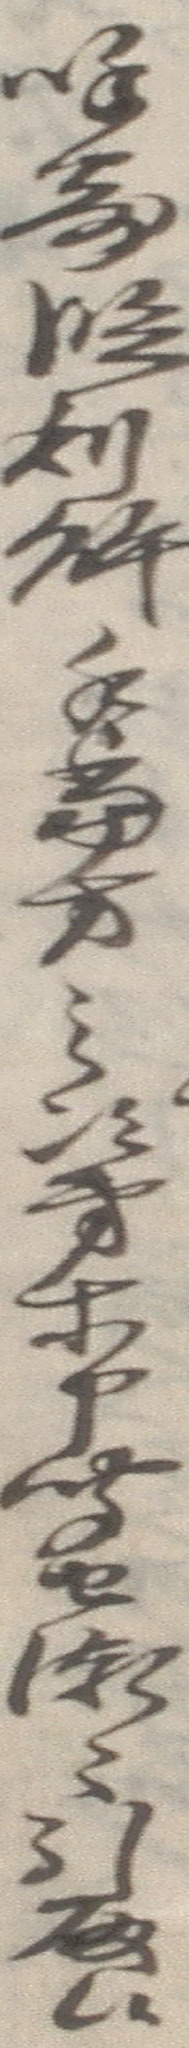呼寄段利解手当方之次第等申聞せ漸々引取候
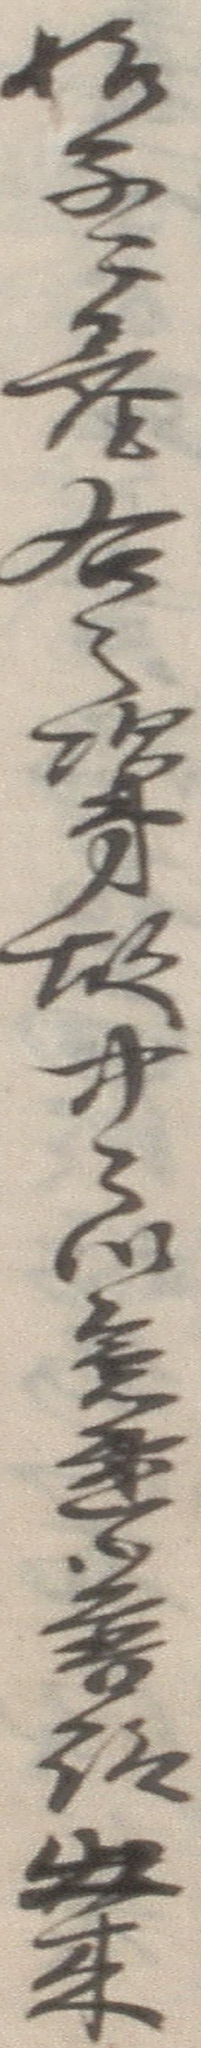様子二御座候右之次第故中々以急速御普請出来
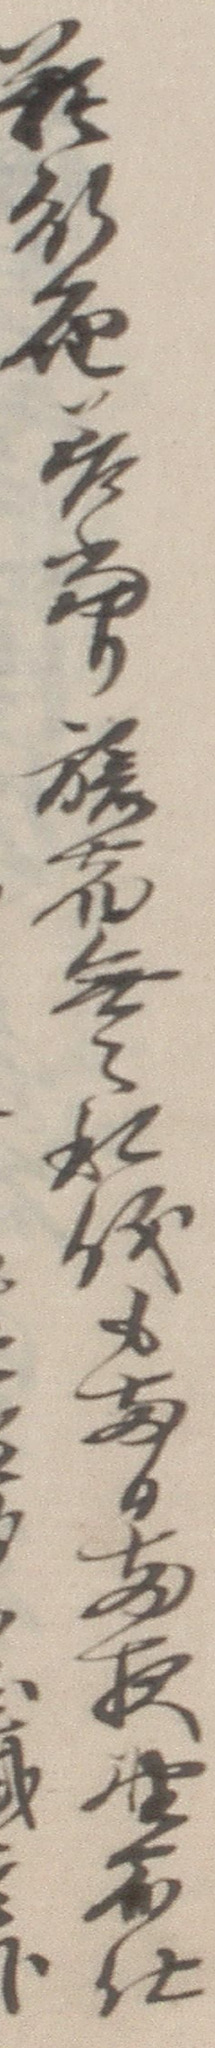難行届差当り旅宿無之私儀も両日両夜野宿仕
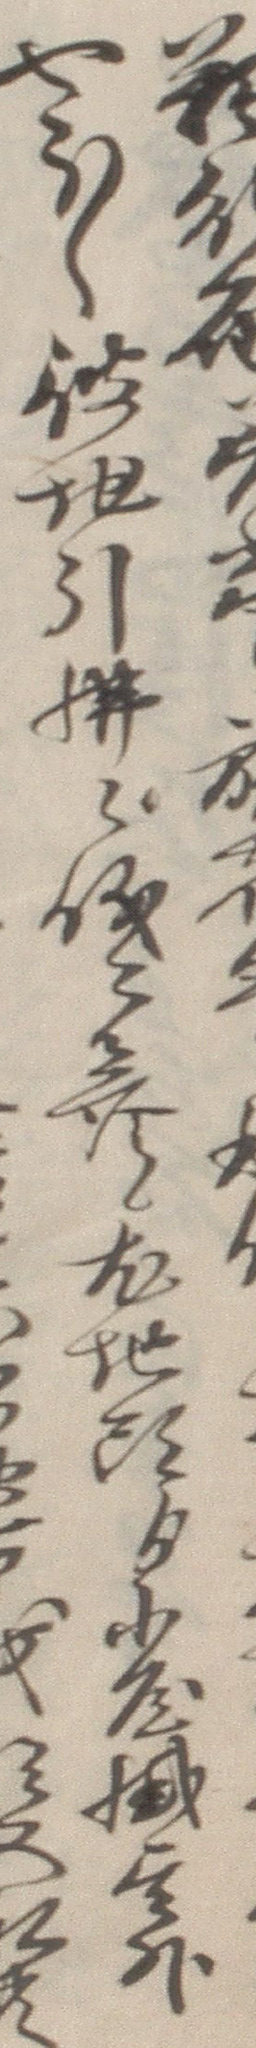やう〳〵彼地引払候儀二御座候尤地頭ゟ小屋掛其外
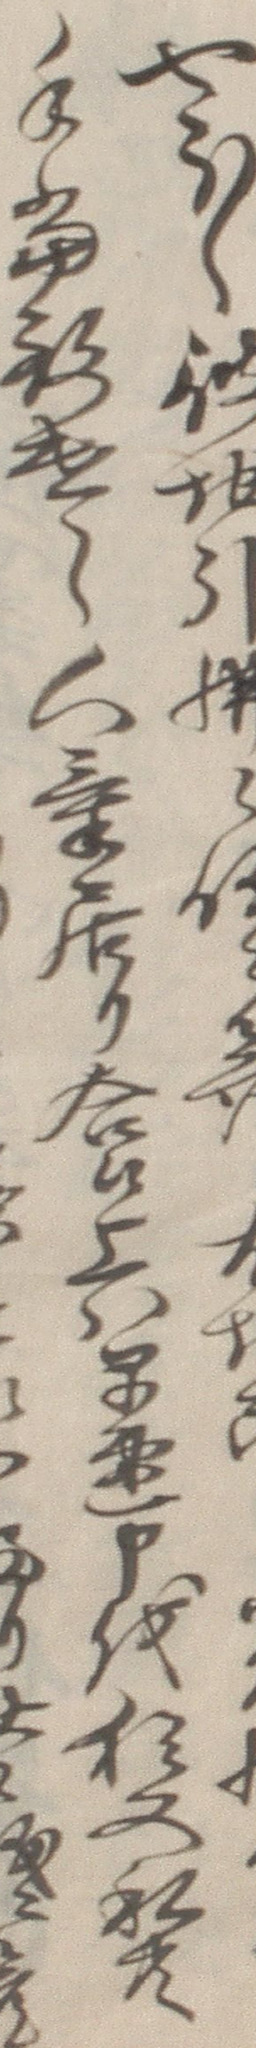手当致遣し人気居り合候上ハ早速申儀猶又私共
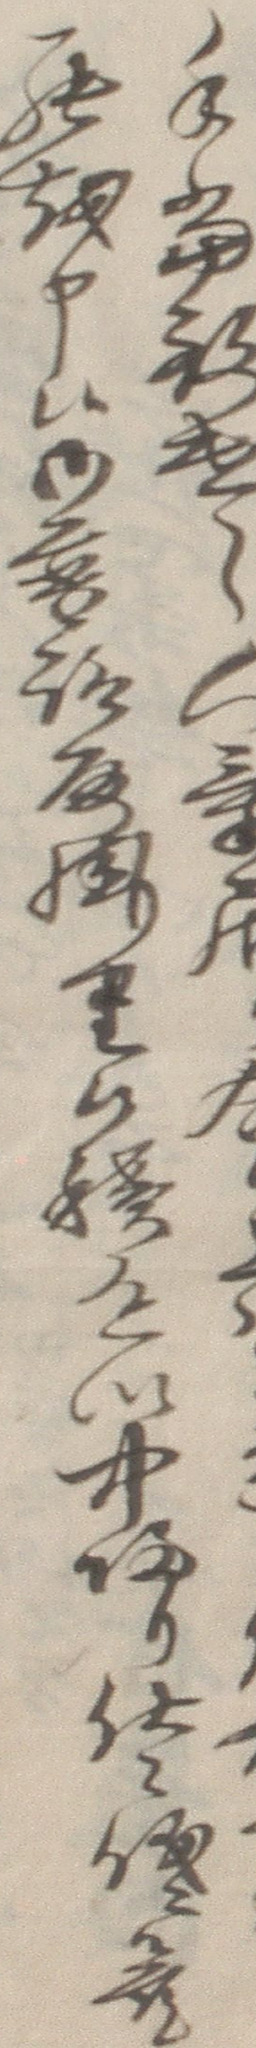罷越申候御普請取掛置候積を以中帰り仕候儀二御座候
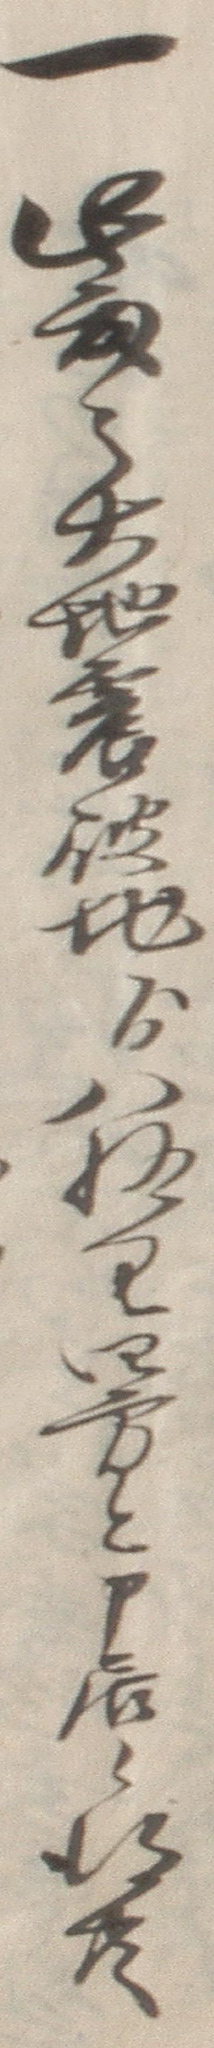一此度之大地震彼地ゟハ拾里四方と申居候得共
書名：信州地震一件
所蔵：東京大学地震研究所図書室 Earthquake Research Institute Library, The University of Tokyo, JAPAN
